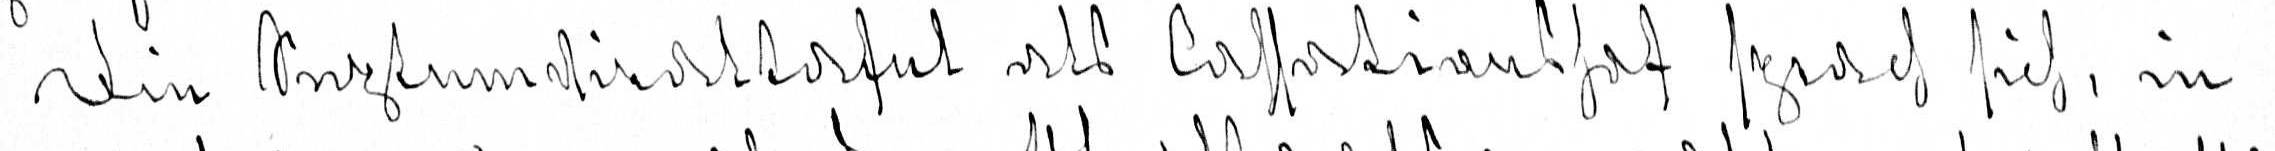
Die Septemdieattafet als Cassationshof Sprach sich, in
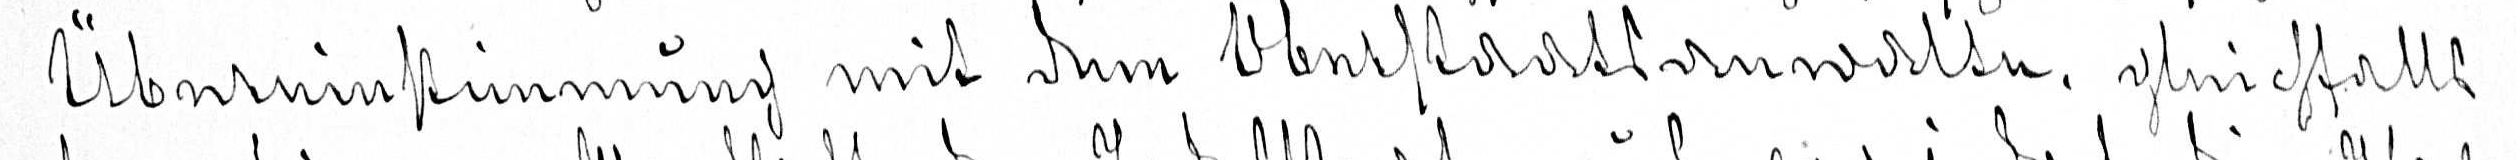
Übereinstimmung mit dem Oberstaatsanwalte, gleichfalls
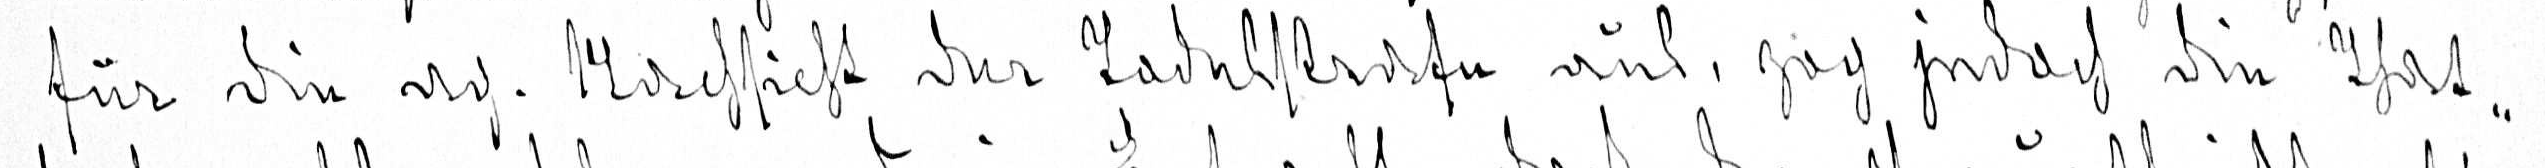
aus, zog jedoch die That¬
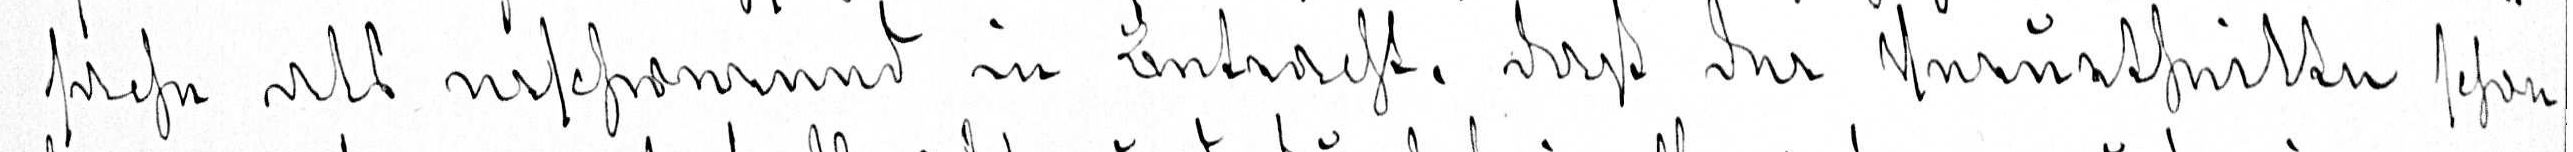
sache als erschwerend in Betracht, daß Verurtheilte schon
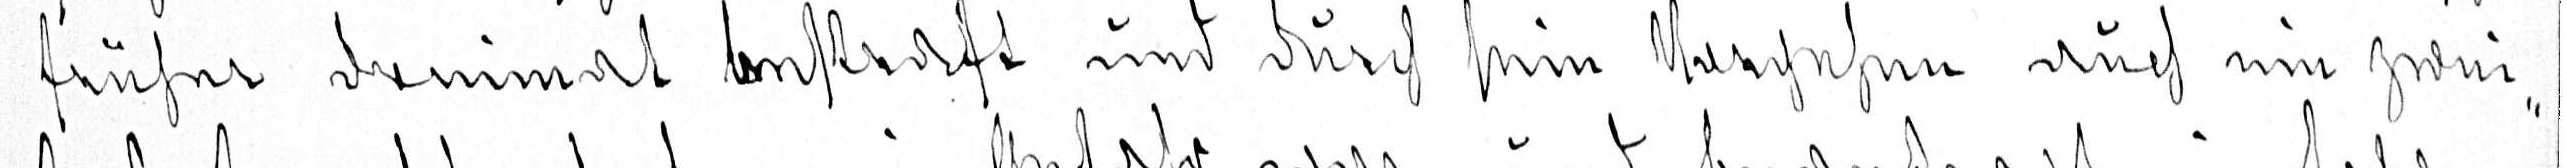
früher dreimal bestraft und durch sein Vorgehen auch ein zwei¬
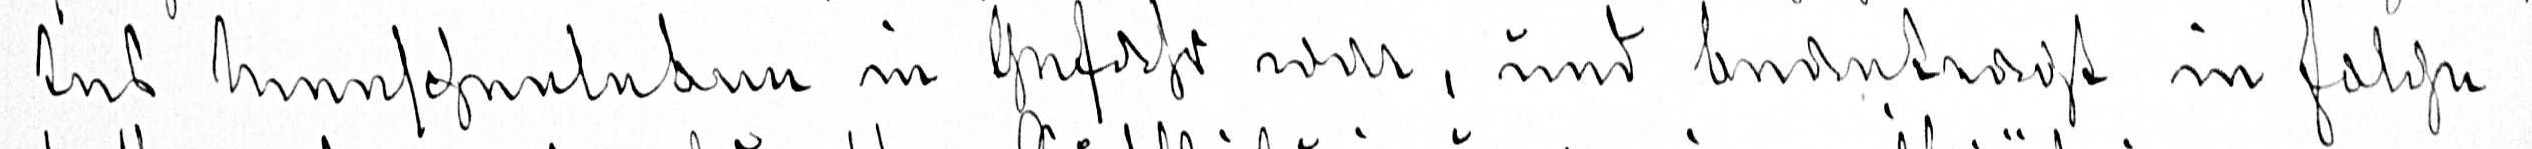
tes Menschenleben in Gefahr war, und beantragt in Folge
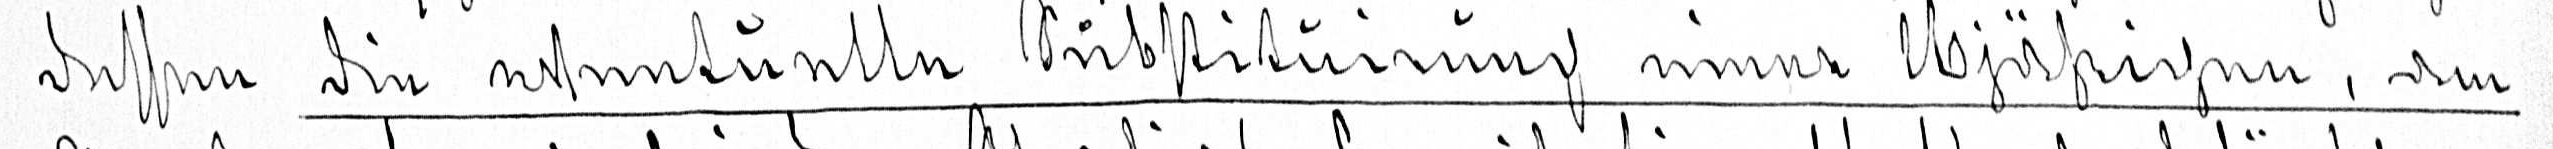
dessen die eventuelle Substituirung einer 16jährigen, am
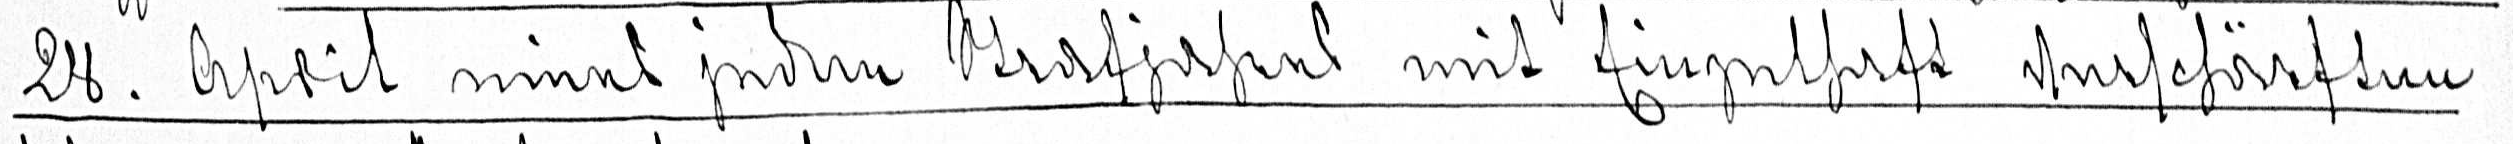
28. April eines jeden Strafjahres mit Einzelhaft verschärften
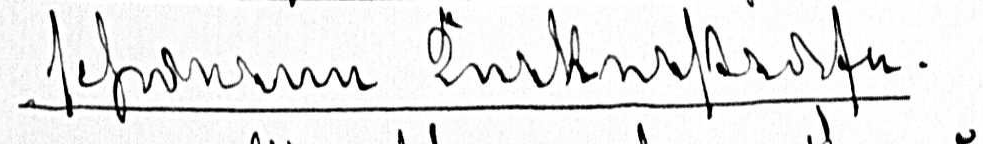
schweren Kerkerstrafe.
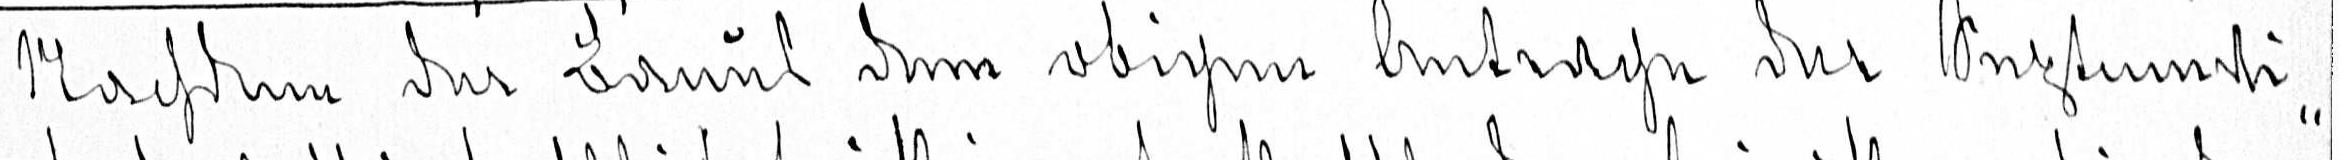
Nachdem der Banus dem obigen Antrage der Septemvi¬
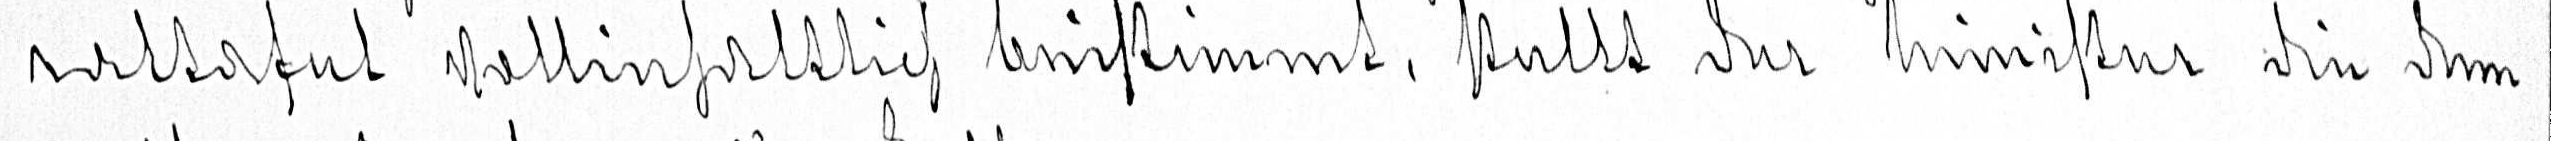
raltafel vollinhaltlich beistimmt, stellt der Minister die dem
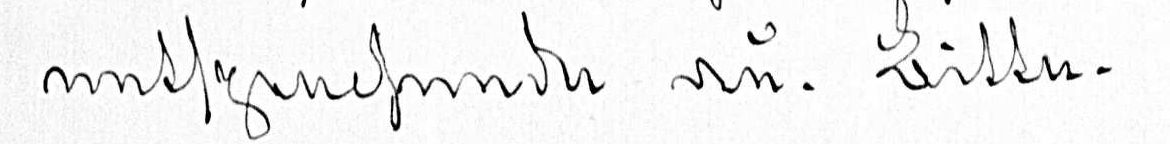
entsprechende au. Bitte.
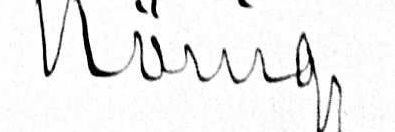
König
